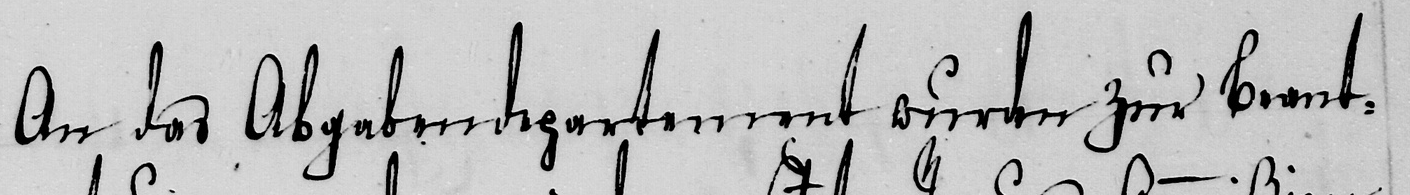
An das Abgabendepartement wurden zur Beant¬
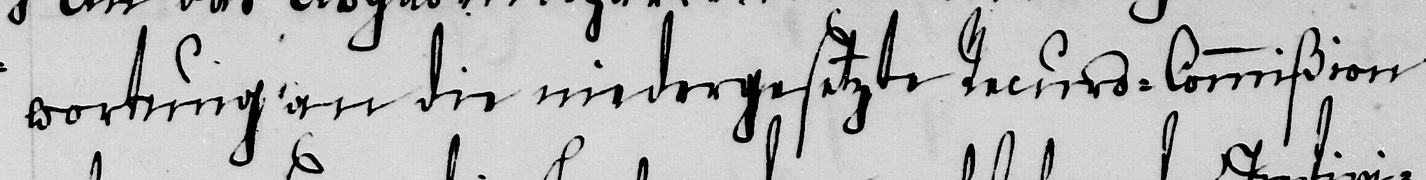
wortung an die niedergesetzte Recurs-Commißion
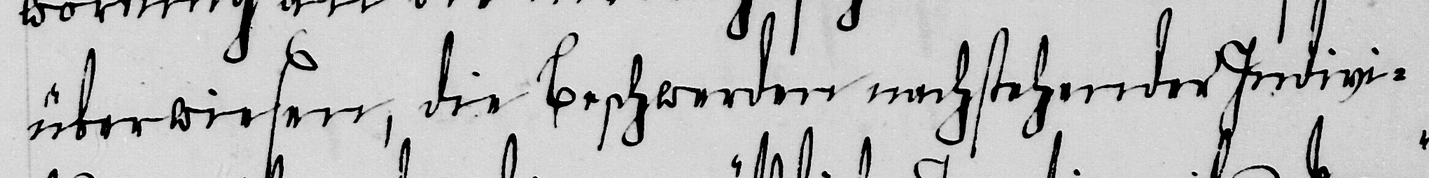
überwiesen, die Beschwerden nachstehender Indivi¬
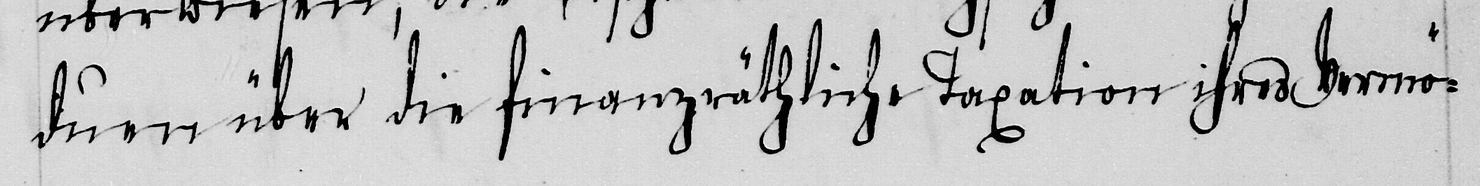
duen über die finanzräthliche Taxation ihres Vermö¬
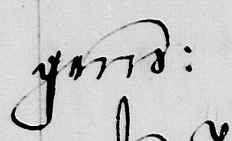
gens:
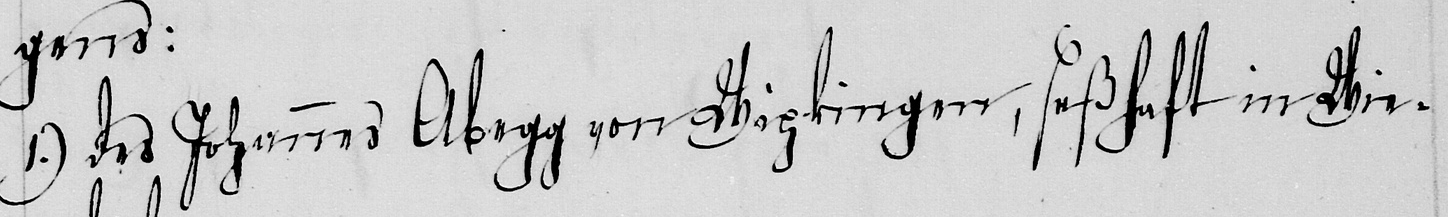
1.) des Johannes Abegg von Wipkingen, seßhaft in Wie¬
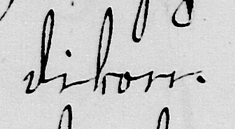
dikon.
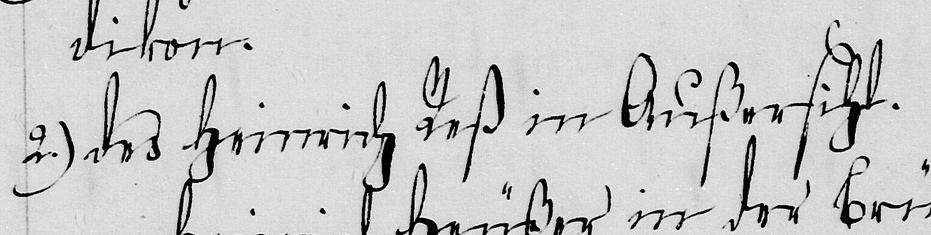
2.) des Heinrich Reß in Außersihl.
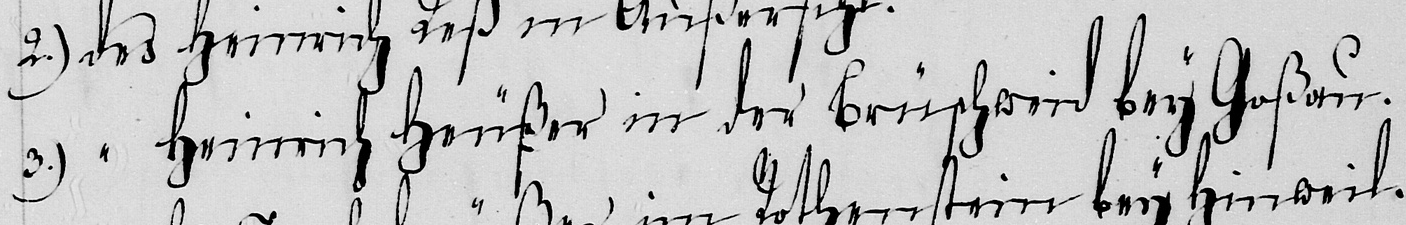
3.) “ Heinrich Heußer in der Brüschweid bey Goßau.
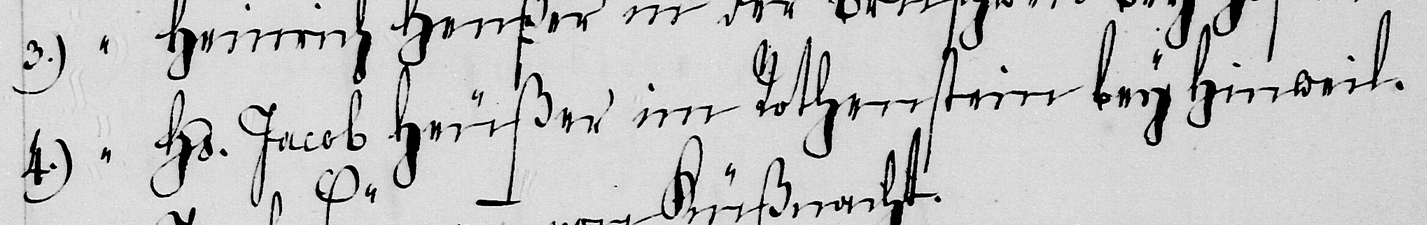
4.) “ Hs. Jacob Heußer im Rothenstein bey Hinweil.
